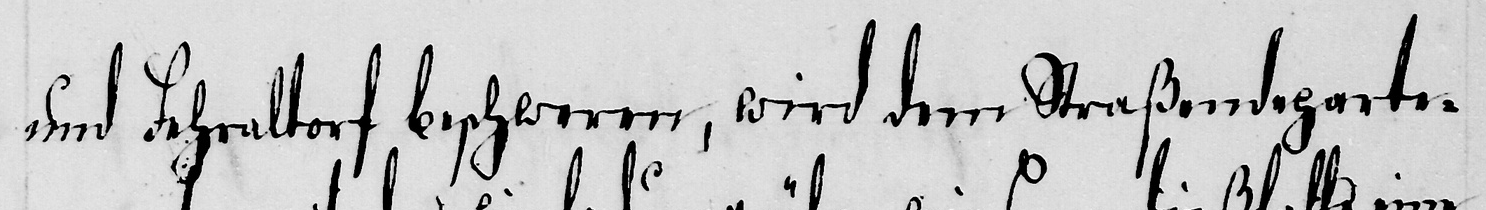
und Fehraltorf beschweren, wird dem Straßendeparte¬
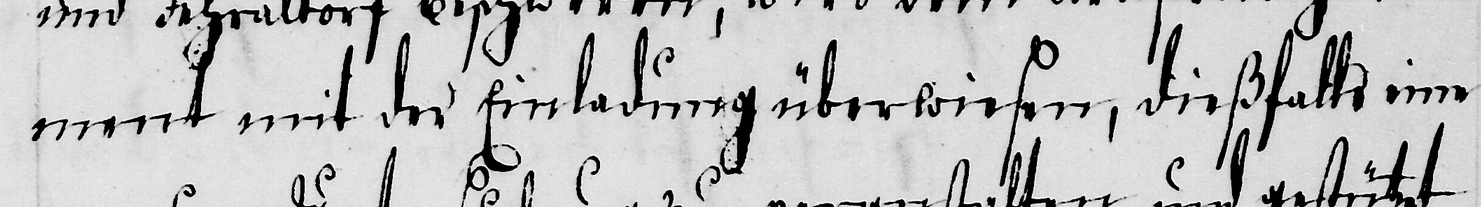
ment mit der Einladung überwiesen, dießfalls eine
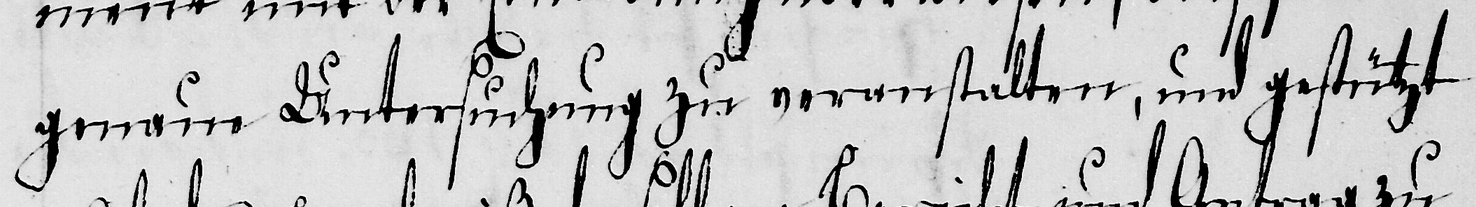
genaue Untersuchung zu veranstalten, und gestützt
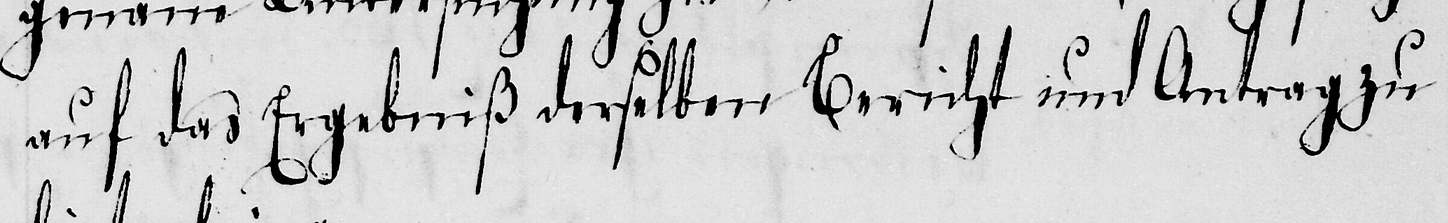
auf das Ergebniß derselben Bericht und Antrag zu
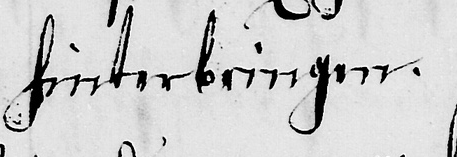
hinterbringen.
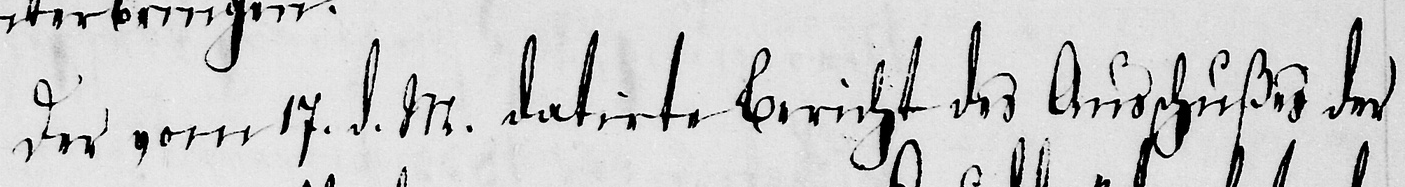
Der vom 17. d. M. datirte Bericht des Ausschußes der
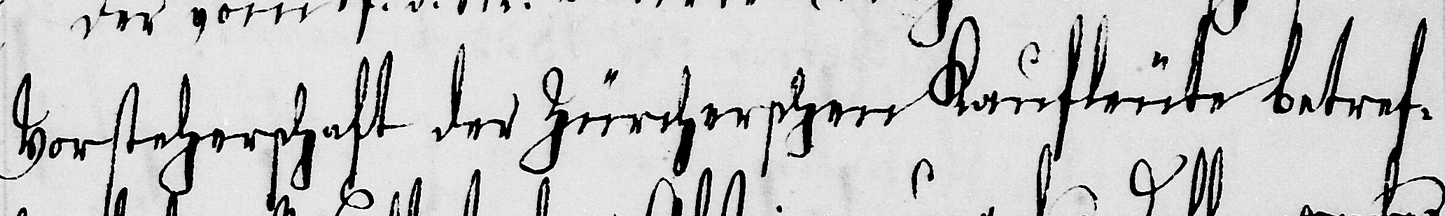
Vorsteherschaft der Zürcherschen Kaufleute betref¬
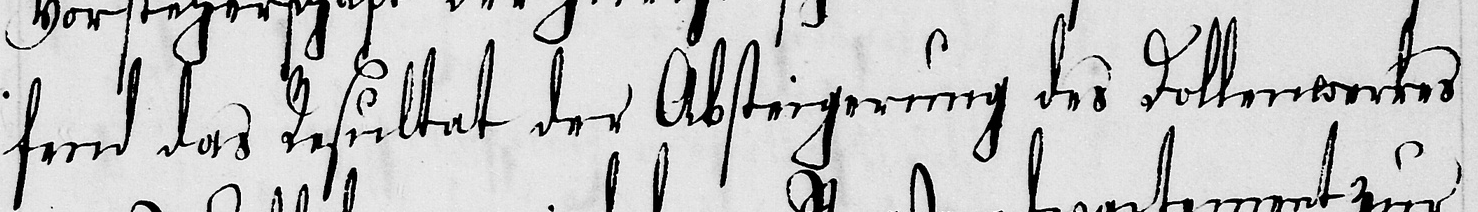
fend das Resultat der Absteigerung des Dollenwerkes
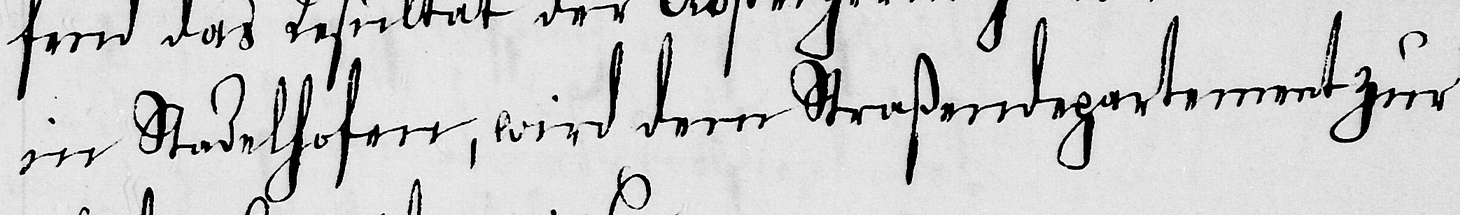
in Stadelhofen, wird dem Straßendepartement zur
